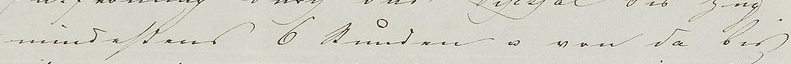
mindestens 6 Stunden & von da bis
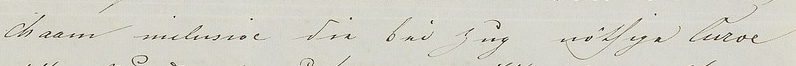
Chaam inclusive die bei Zug nöthige Curve
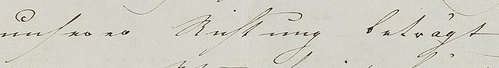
unserer Richtung beträgt.
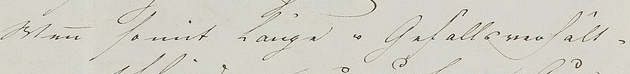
Wenn somit Länge & Gefällsverhält-
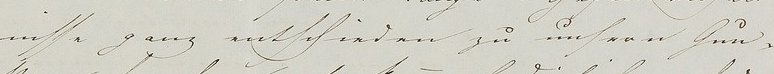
nisse ganz entschieden zu unsern Gun-
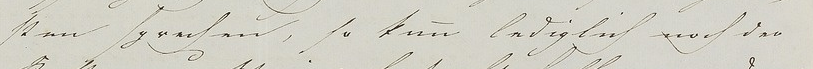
sten sprechen, so kann lediglich noch der
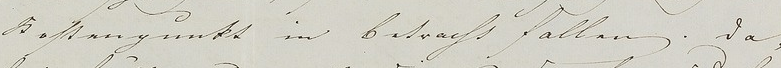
Kostenpunkt in Betracht fallen. Da-
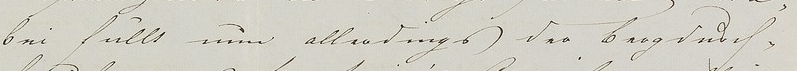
bei fällt nun allerdings der Bergdurch-
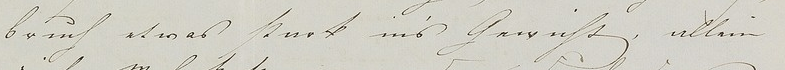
bruch etwas stark in's Gewicht, allein
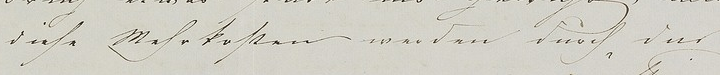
diese Mehrkosten werden durch das
